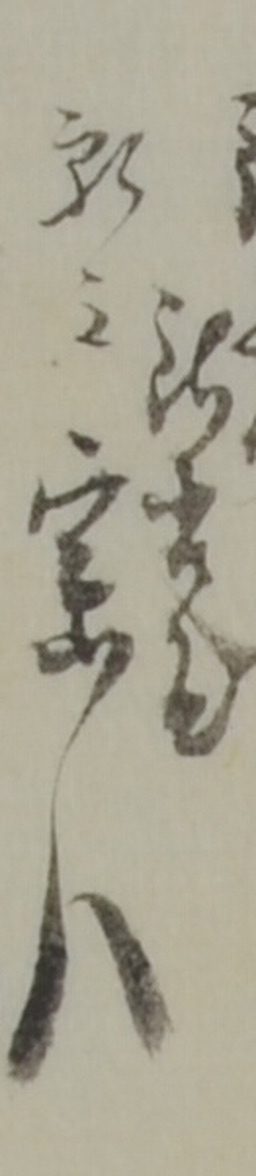願主宗八
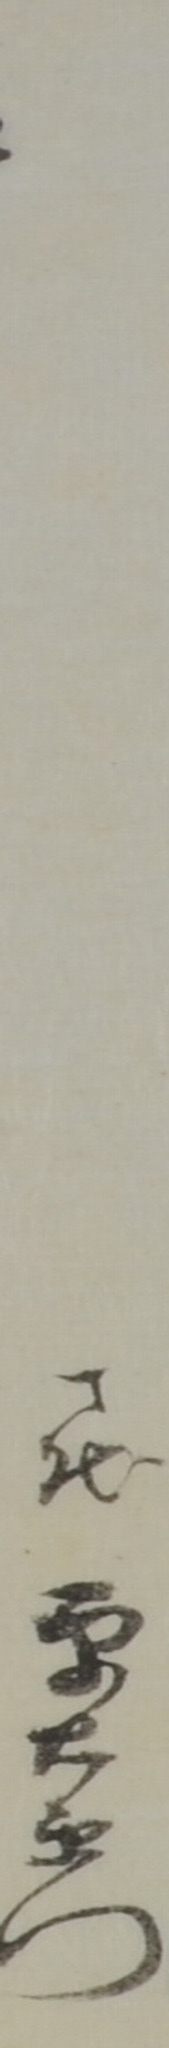町代平右衛門
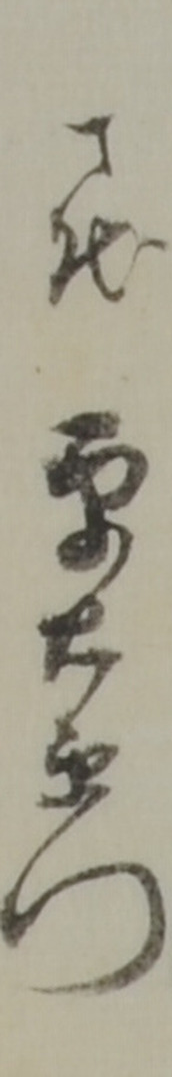町代平右衛門
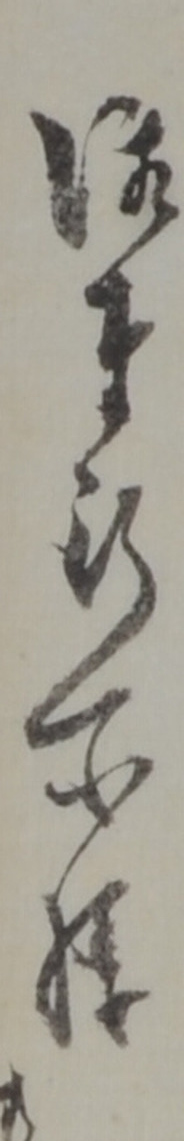御奉行所様
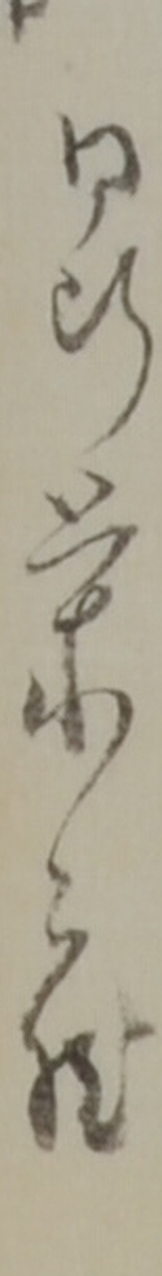同断栄蔵
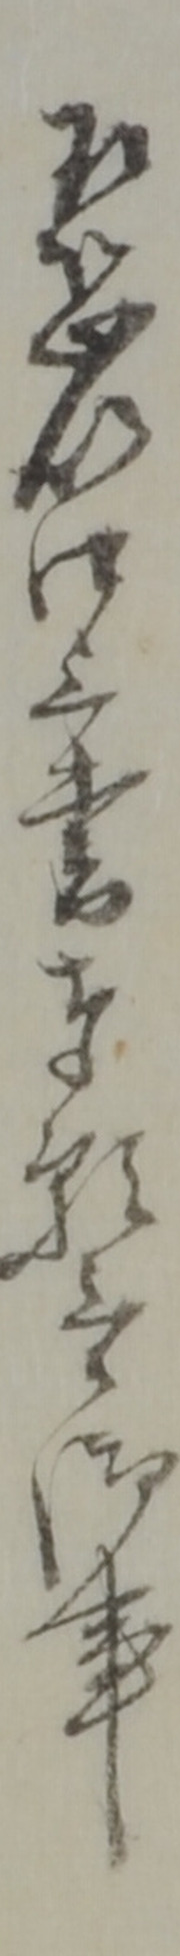乍恐以口上書奉願上候御事
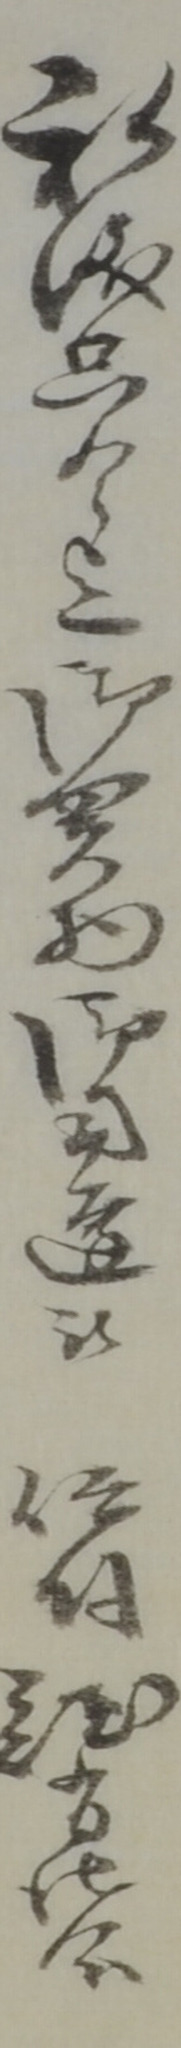私儀只今迄御買物御用達被仰付難有仕合
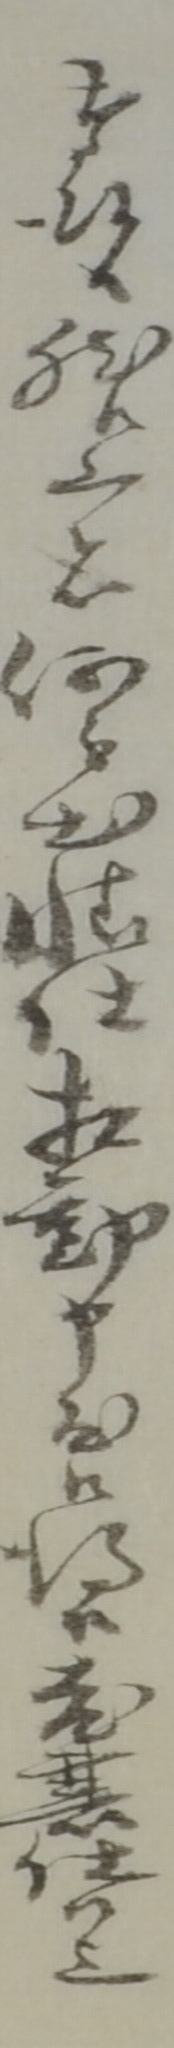奉存候然ル上者何分出情仕相勤申度候得共老衰仕候上
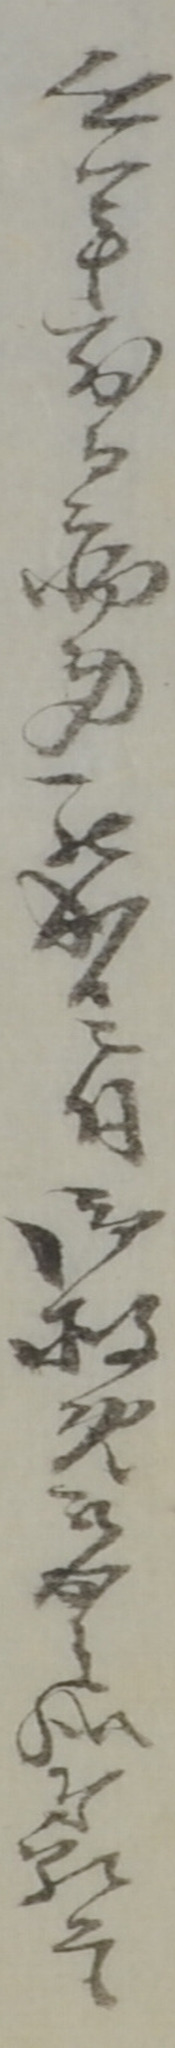近年別而病身罷成候ニ付御赦免被成下候様奉願上候
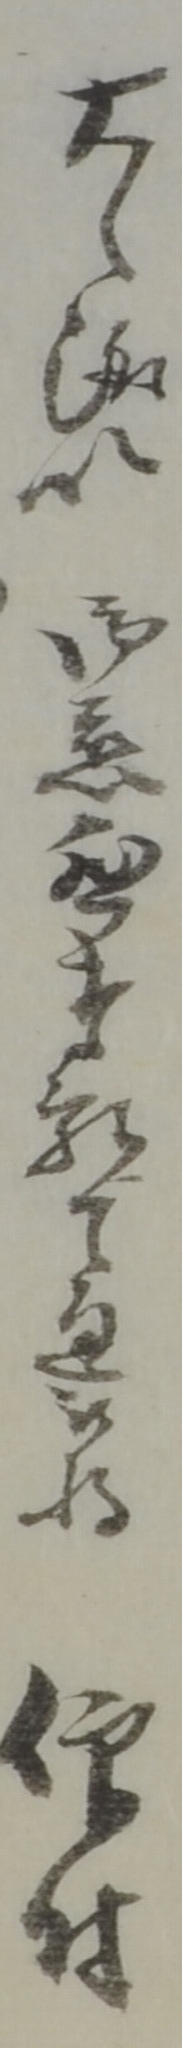右之趣以御慈悲奉願上候通被為仰付
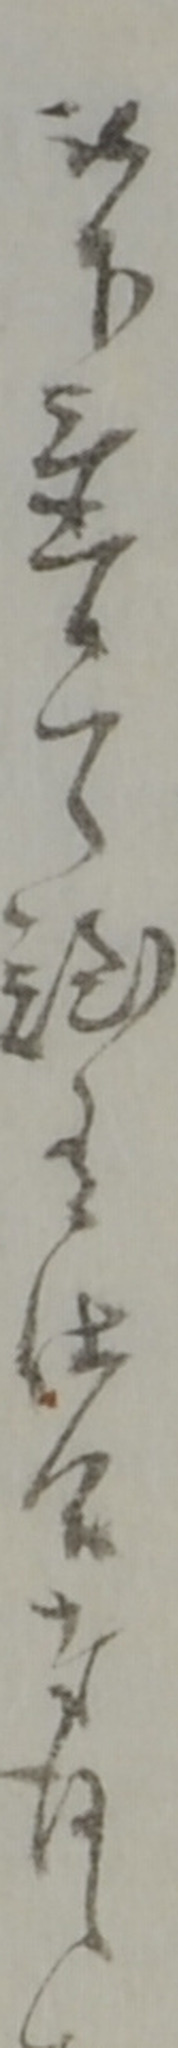被下置候ハヽ難有仕合奉存候以上
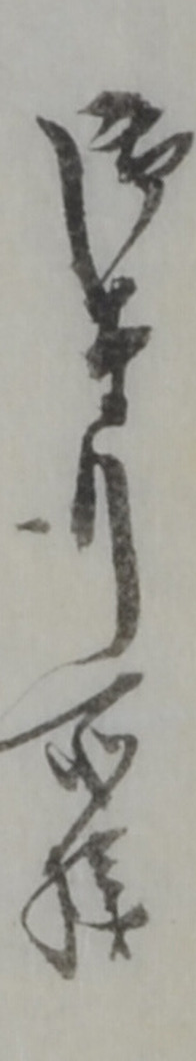御奉行所様

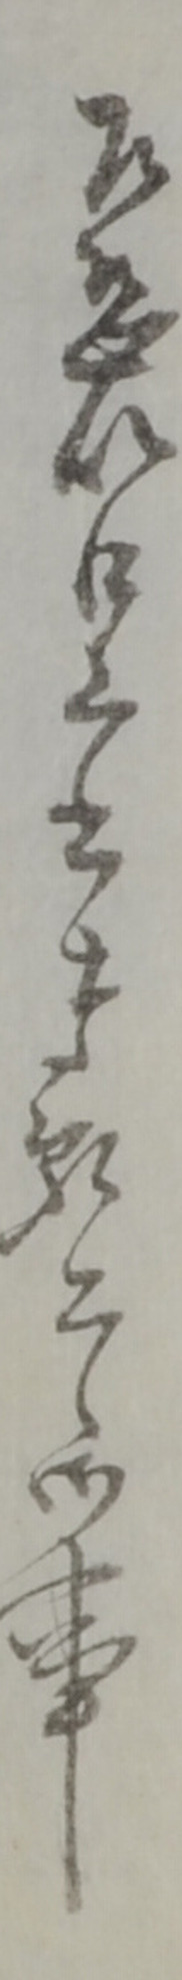乍恐以口上書奉願上候御事
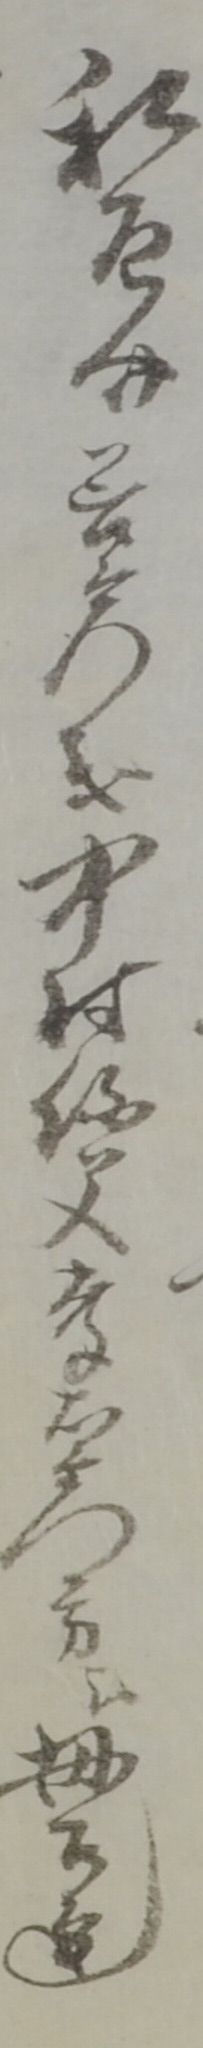私厄介善右衛門義中村儀父孝右衛門方え母召連
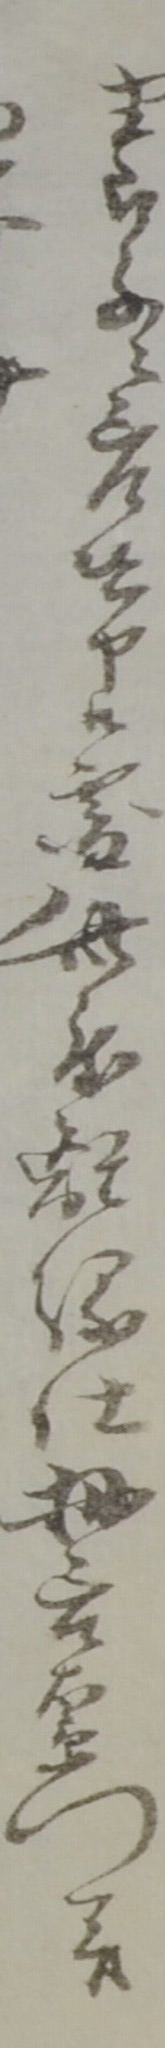養子ニ差出申候処此度離縁仕母善右衛門幷
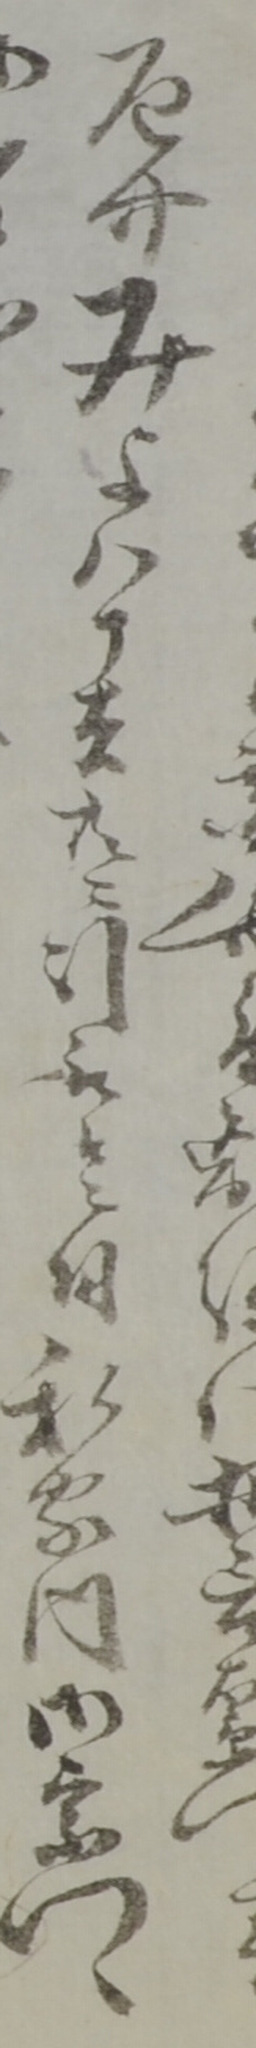厄介みよ八十吉共ニ引取候ニ付私家内御宗門へ
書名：諸願書控帳
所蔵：伊那市立高遠町図書館・合同会社AMANE
